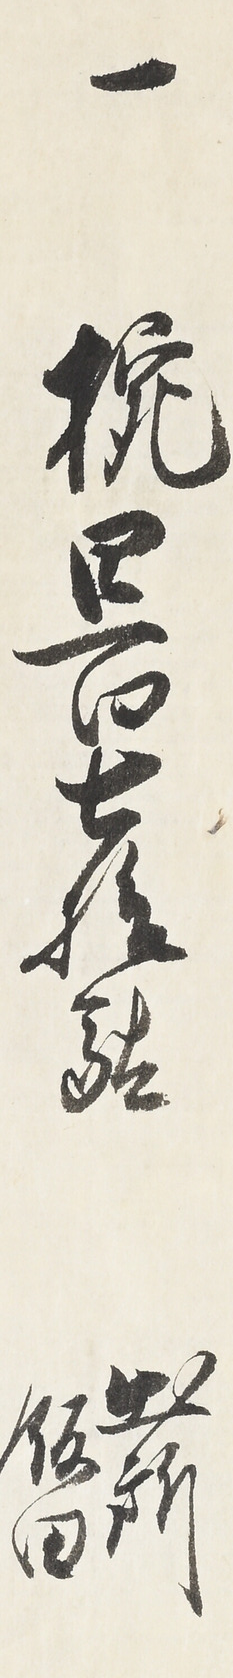一椀四百七拾駄出所
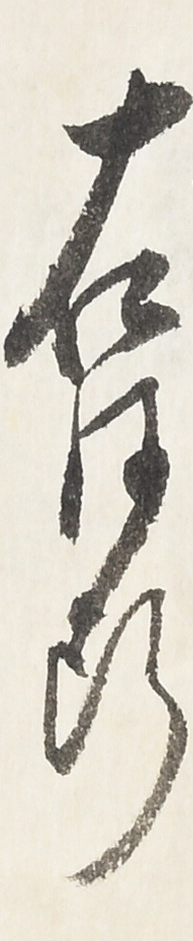右同断
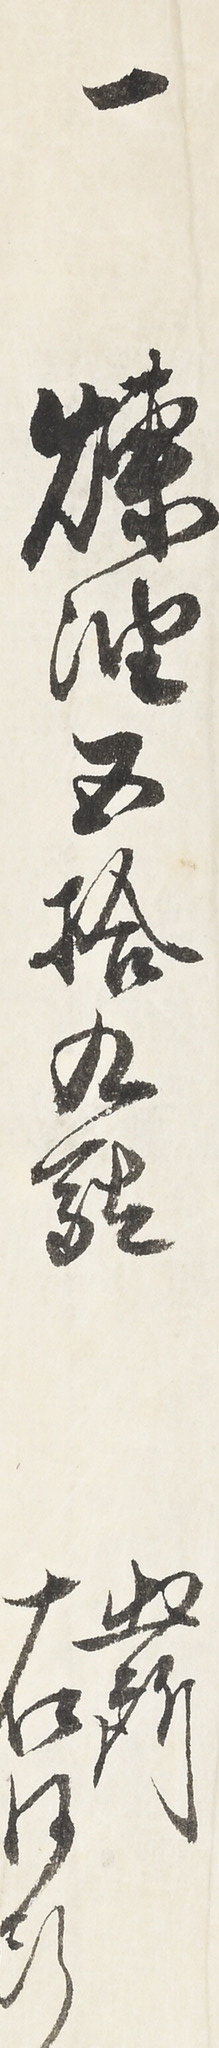一煉油五拾九駄出所
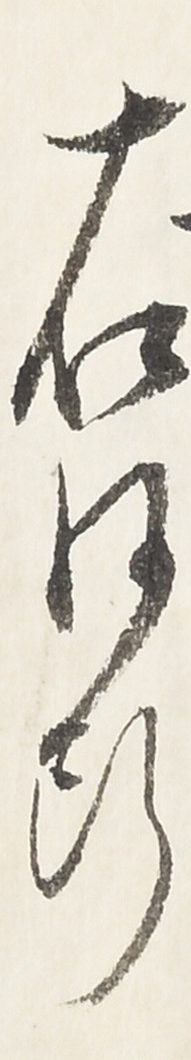右同断
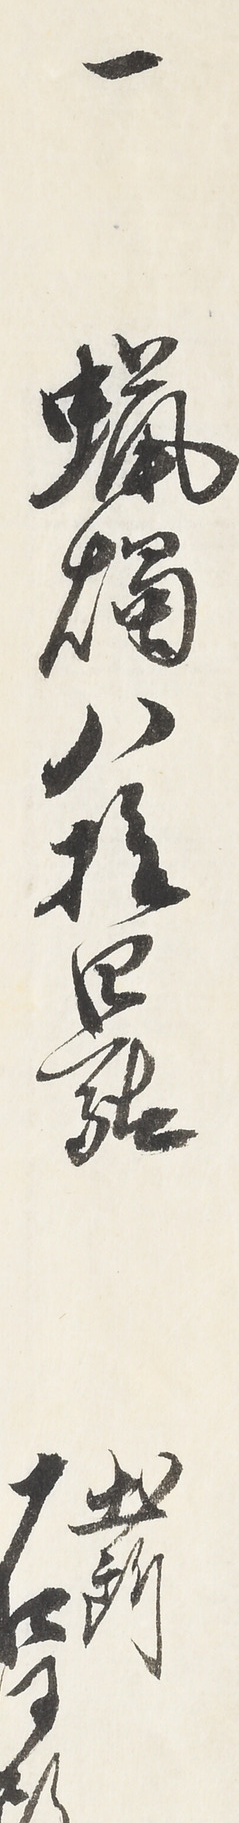一蝋燭八拾四駄出所
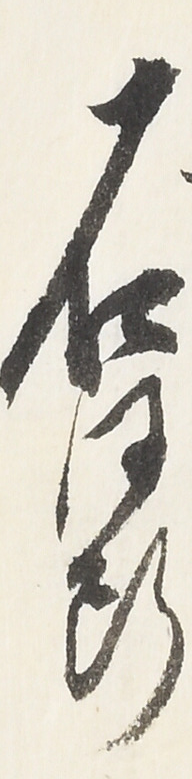右同断
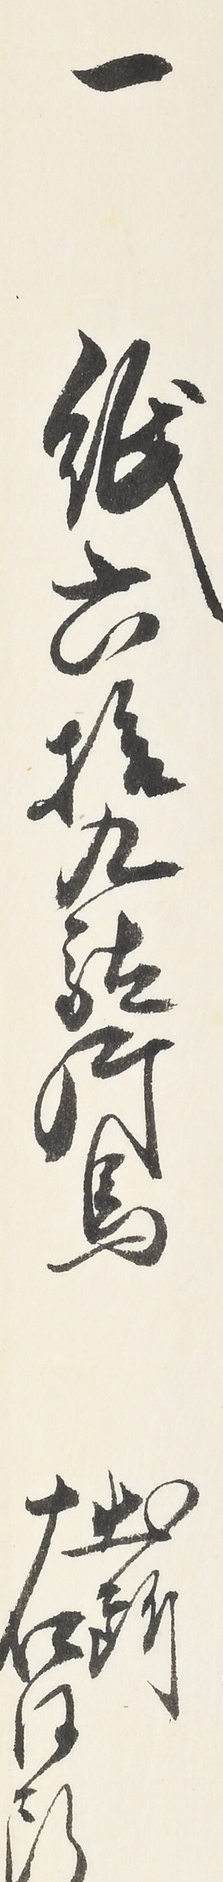一紙六拾九駄片馬出所
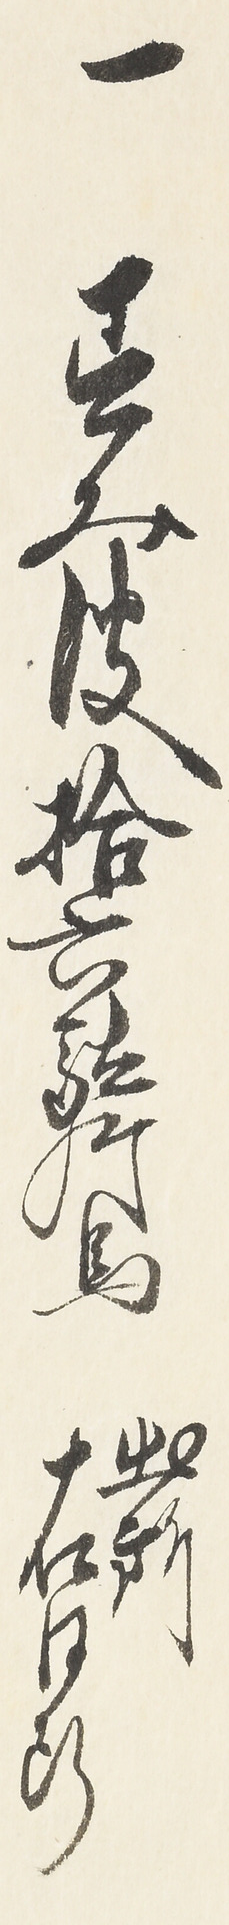一すみ皮拾六駄片馬出所
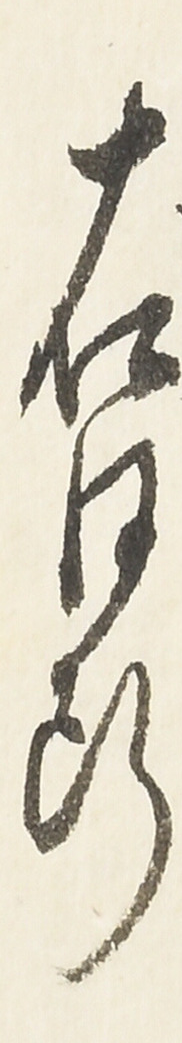右同断
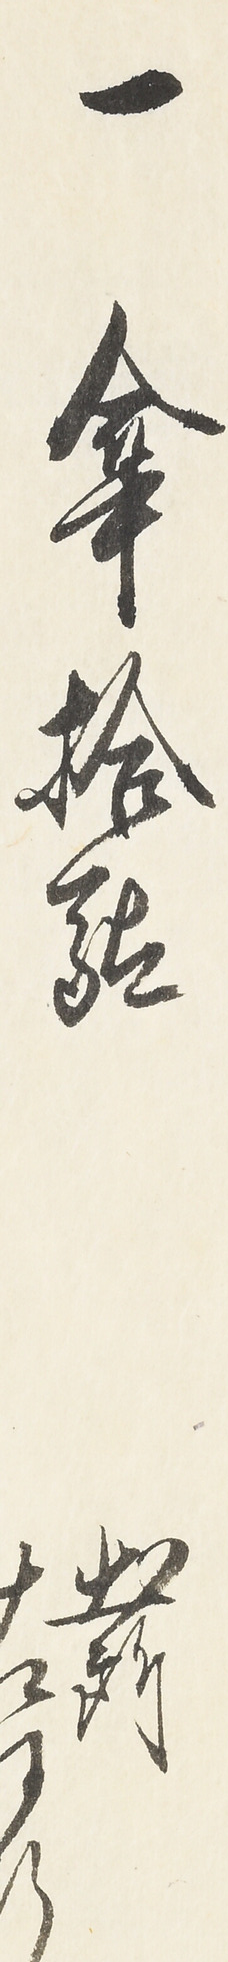一傘拾駄出所
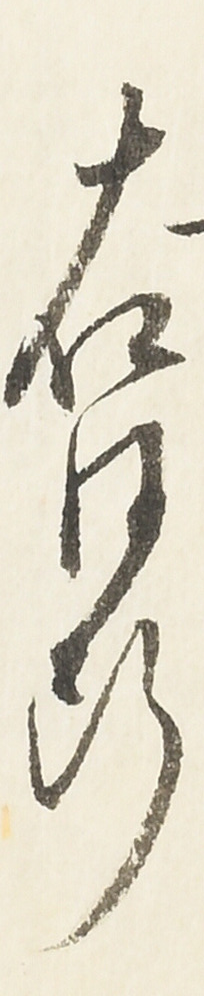右同断
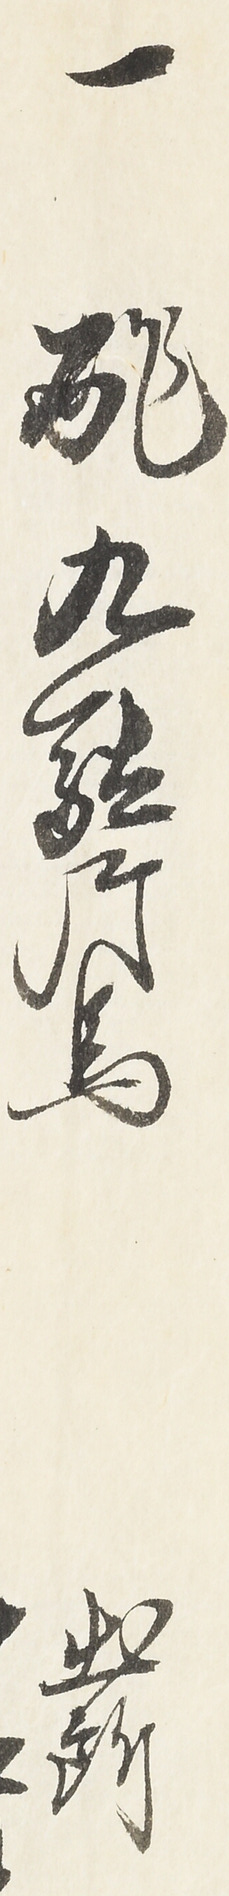一酢九駄片馬出所
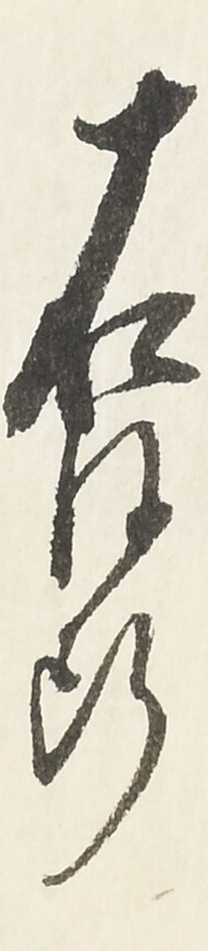右同断
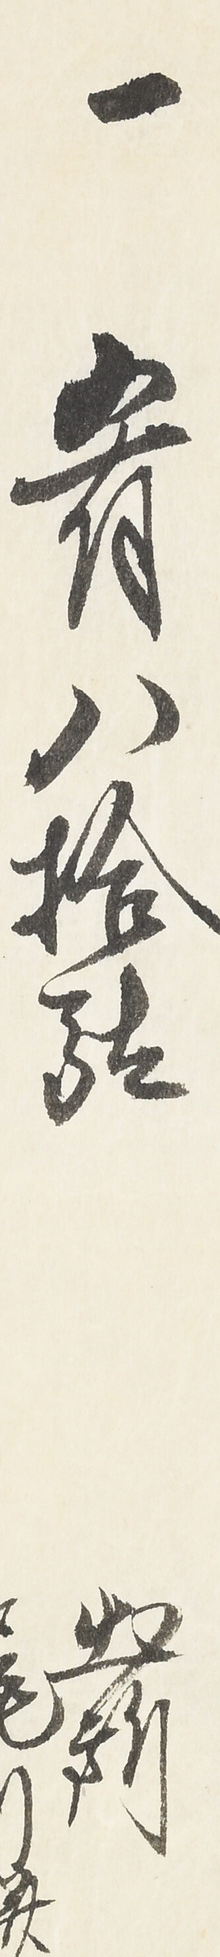一肴八拾駄出所
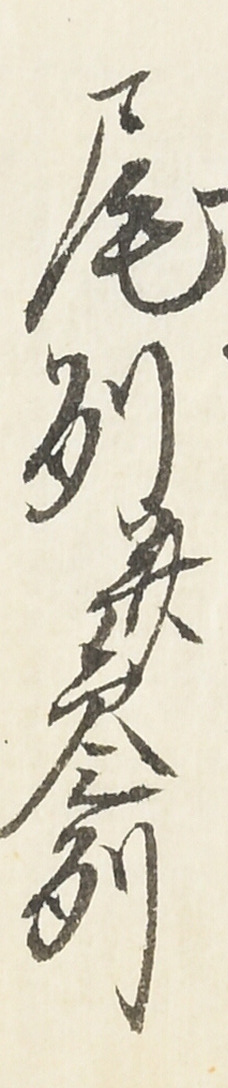尾州并参州

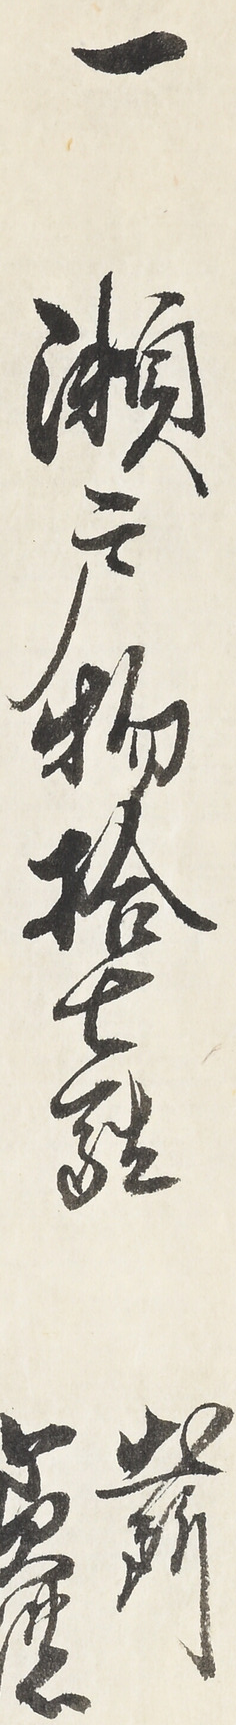一瀬戸物拾七駄出所
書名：中馬ニテ附通候出入荷物目録帳
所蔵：伊那市立高遠町図書館・合同会社AMANE
